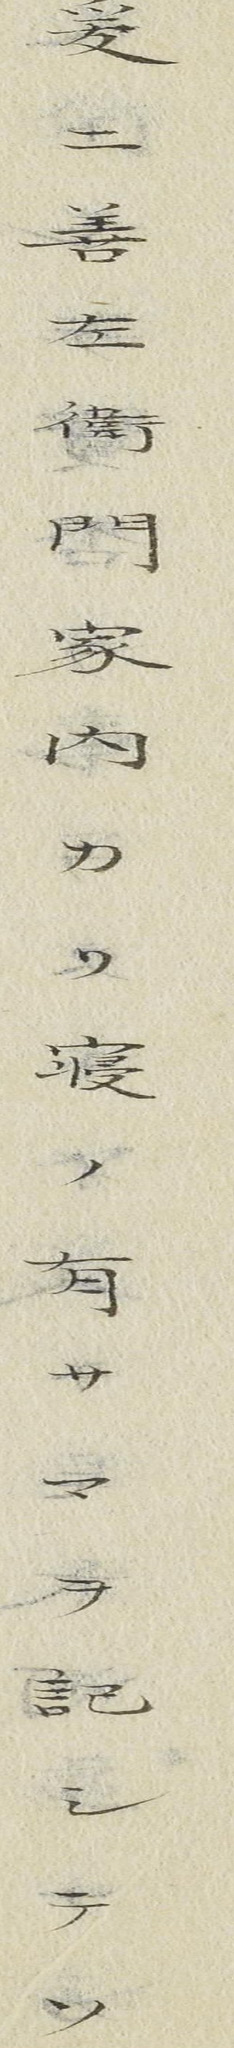爰ニ善左衛門家内カリ寝ノ有サマヲ記シテソ
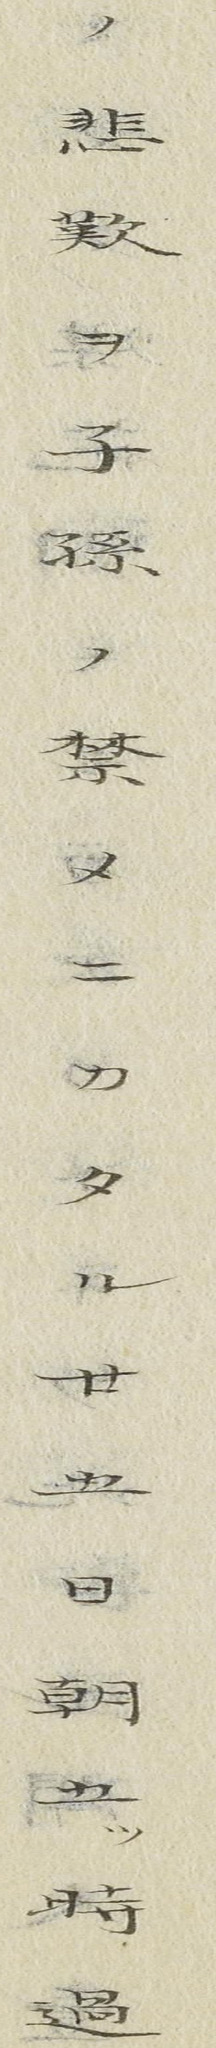ノ悲嘆ヲ子孫ノ禁メニカタル廿五日朝五ツ時過
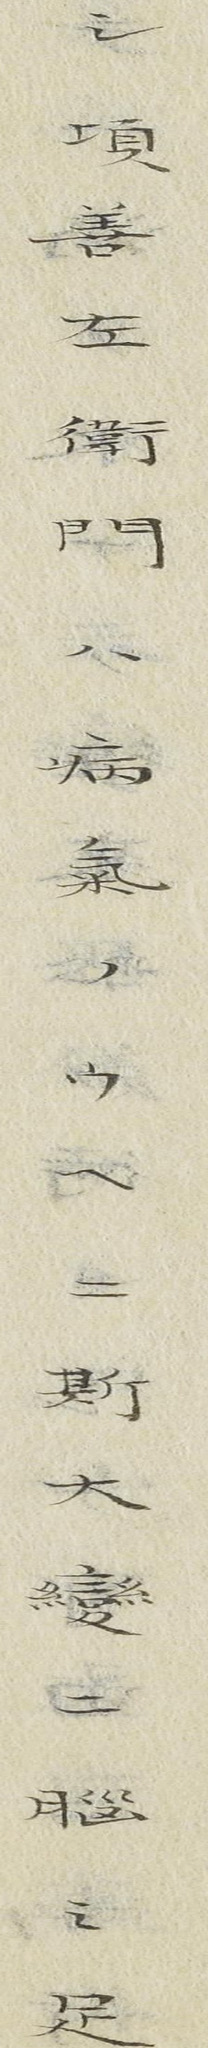シ頃善左衛門ハ病気ノウヘニ斯大變ニ脳ミ足
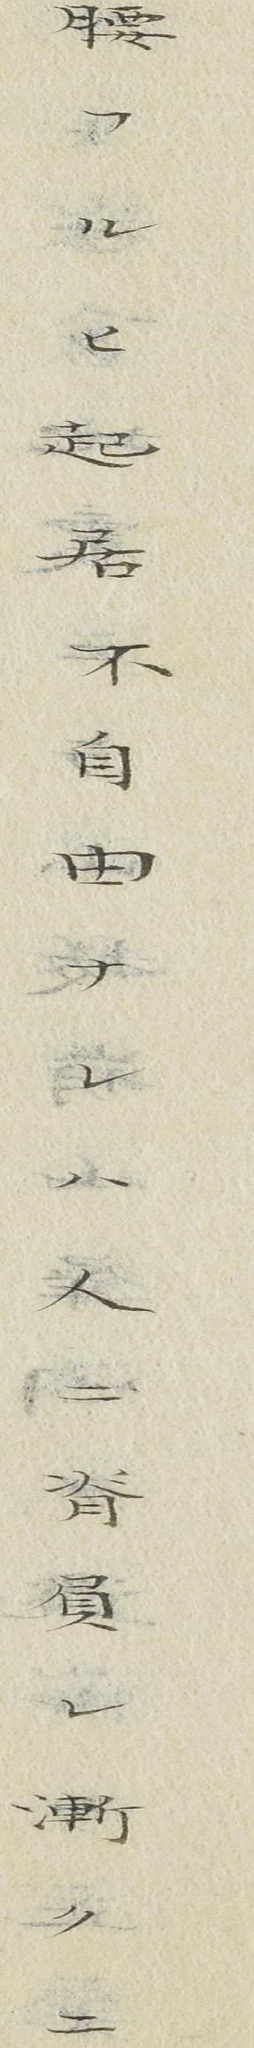腰フルヒ起居不自由ナレハ人ニ背負レ漸クニ
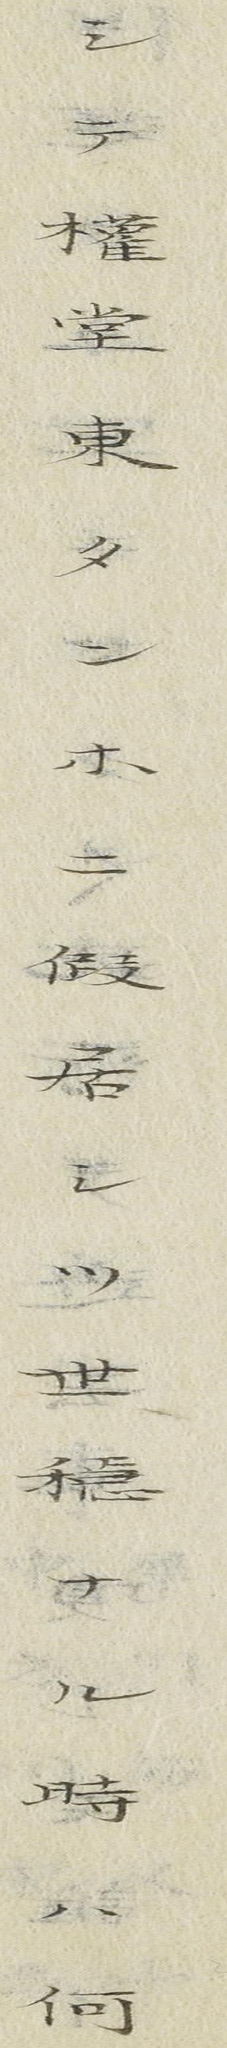シテ権堂東タンホニ仮居シツ世穏ナル時ハ何
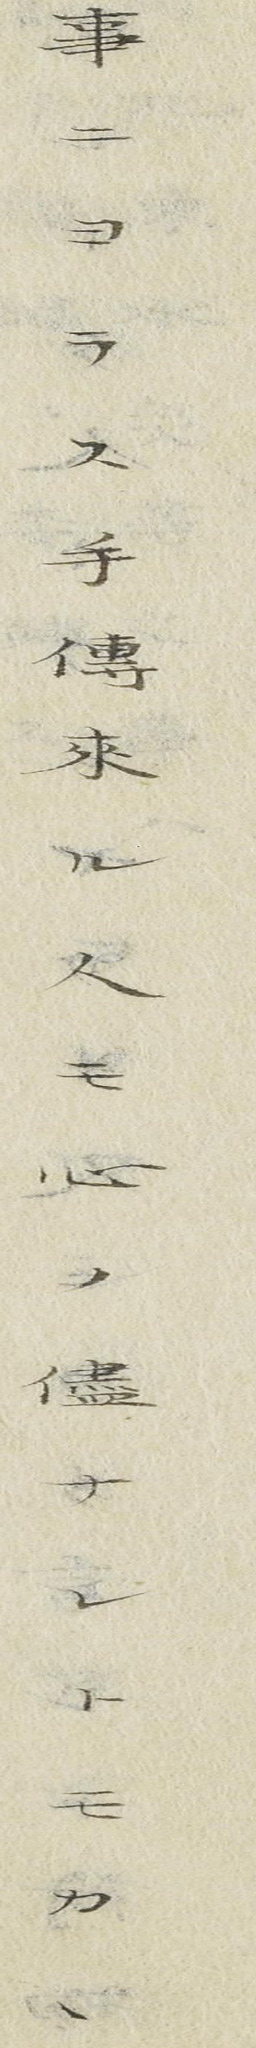事ニヨラス手伝来ル人モ心ノ儘ナレトモカゝ
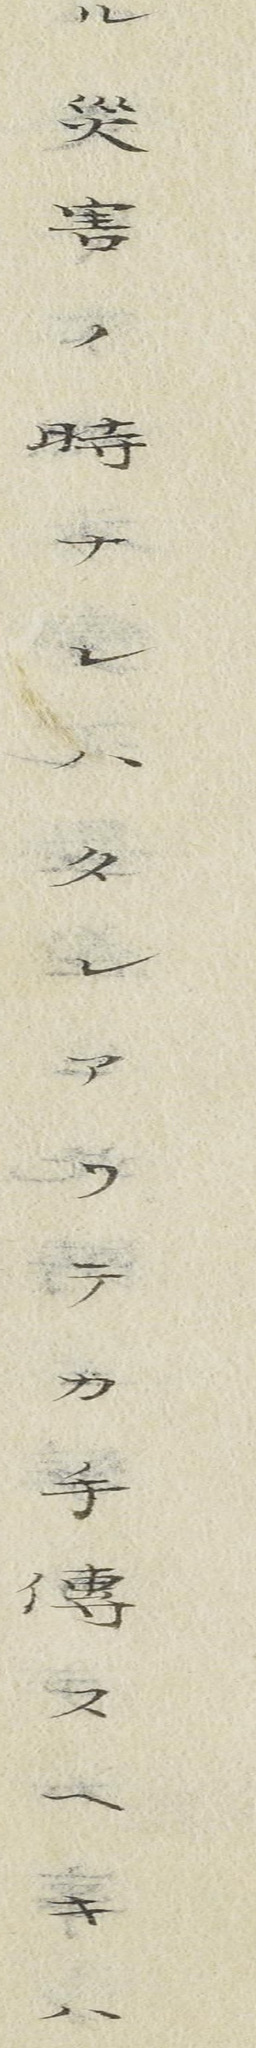リ災害ノ時ナレハタレアリテカ手伝スヘキハ
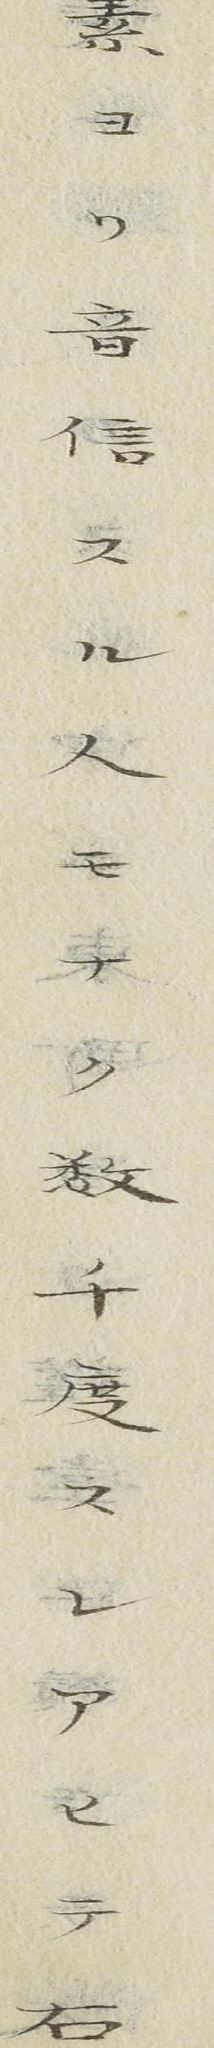素ヨリ音信スル人モナク数千度スレアヒテ右
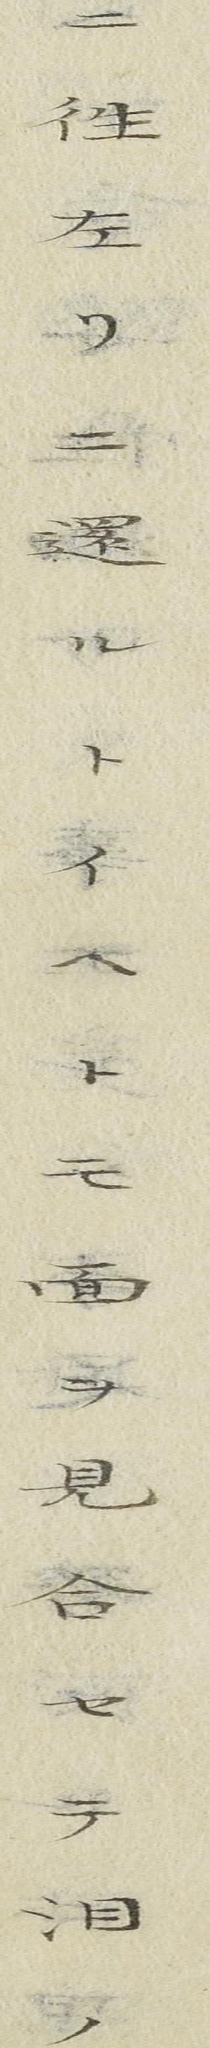ニ往左リニ還ルトイヘトモ面ヲ見合セテ泪ノ
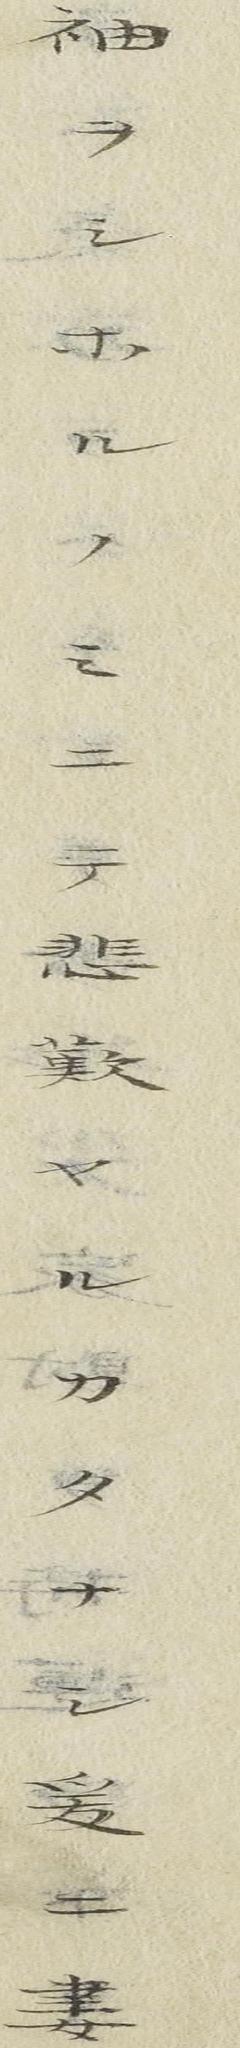袖ヲシホルノミニテ悲嘆ヤルカタナシ爰ニ妻

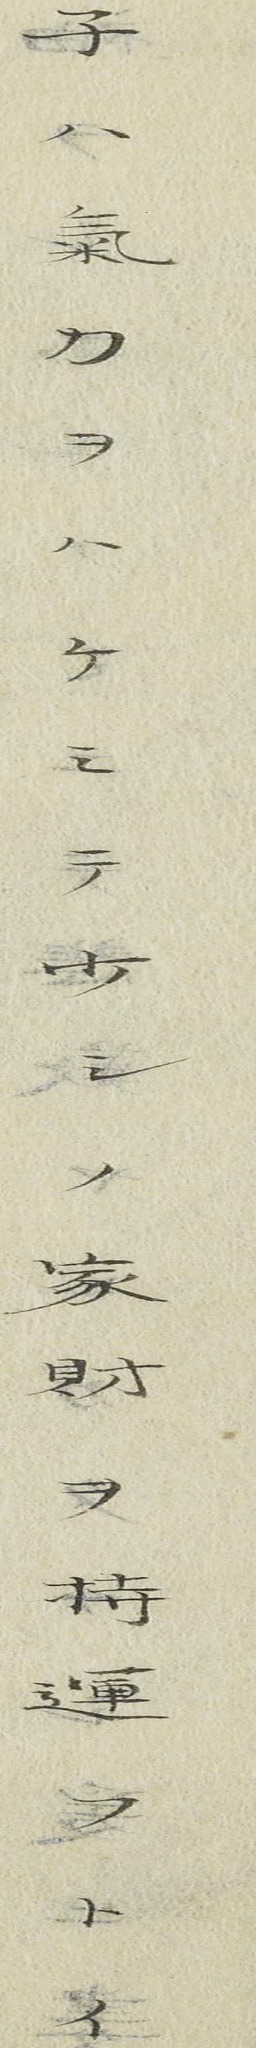子ハ気力ヲハケミテ少シノ家財ヲ持運フトイ
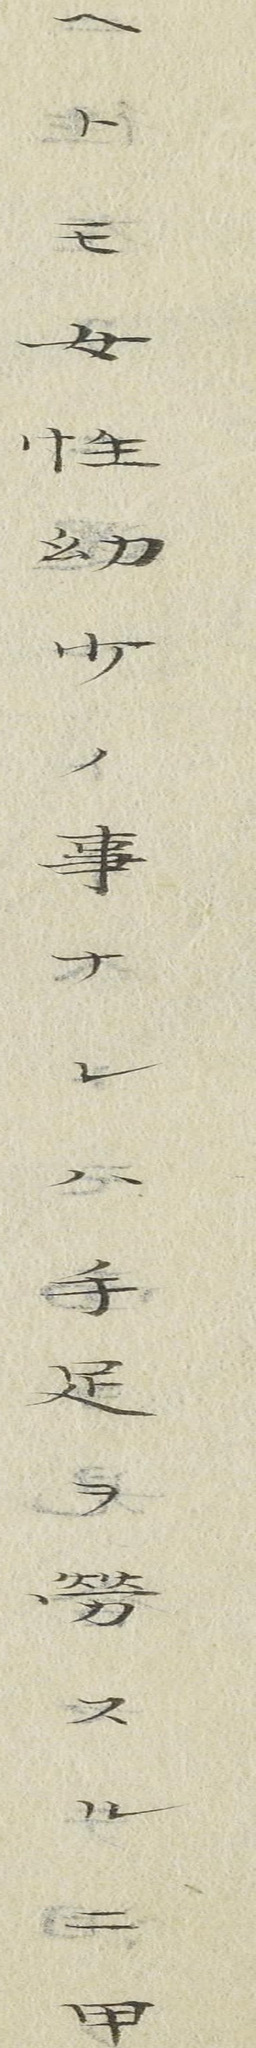ヘトモ女性幼少ノ事ナレハ手足ヲ労スルニ甲
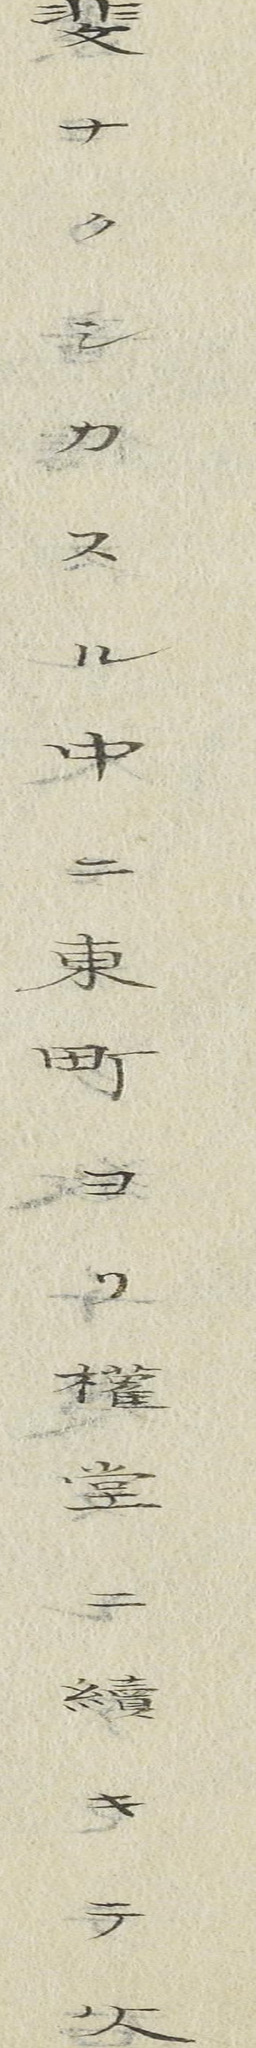斐ナクシカスル中ニ東町ヨリ権堂ニ続キテ火
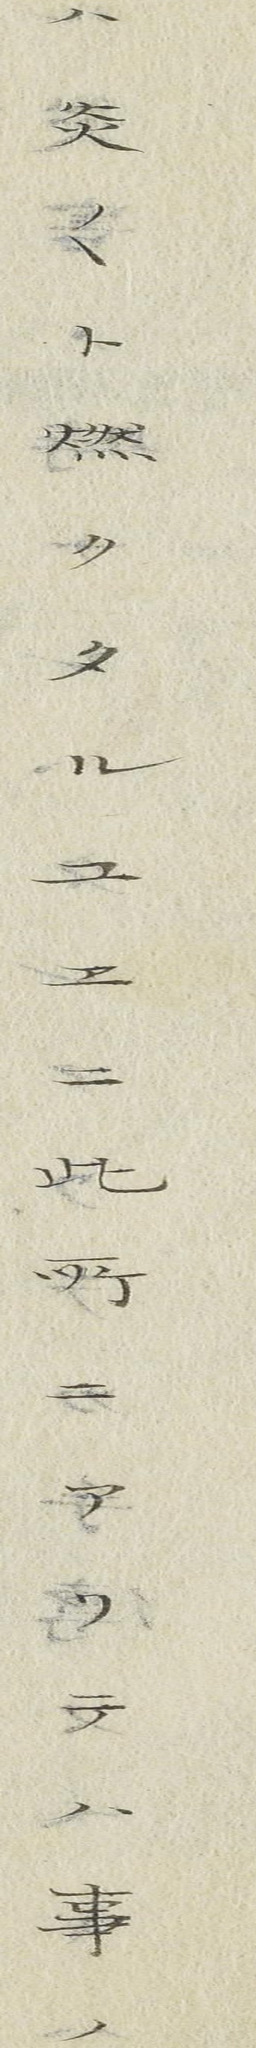ハ炎〱ト燃クタルユエニ此所ニアリテハ事ノ
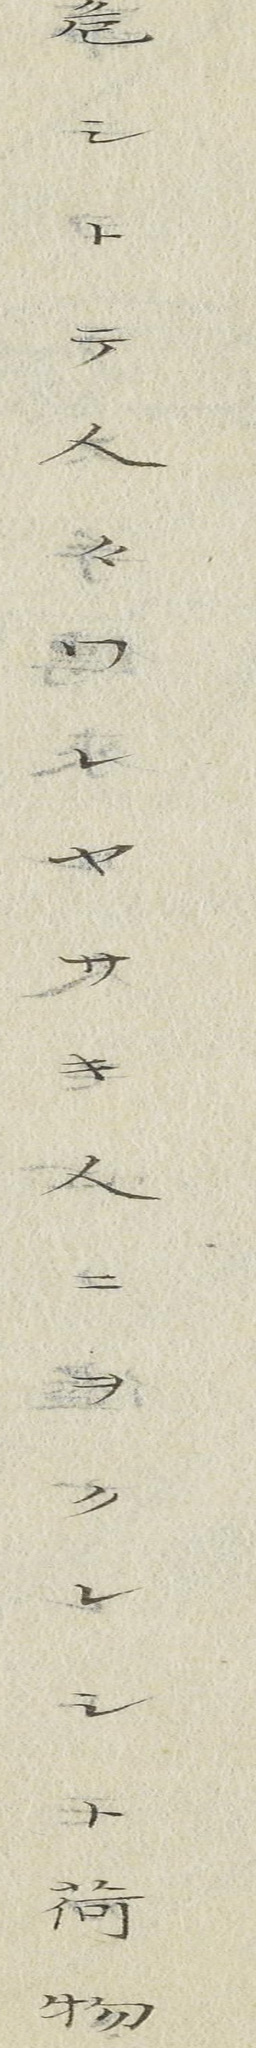危シトテ人々ワレヤサキ人ニヲクレシト荷物
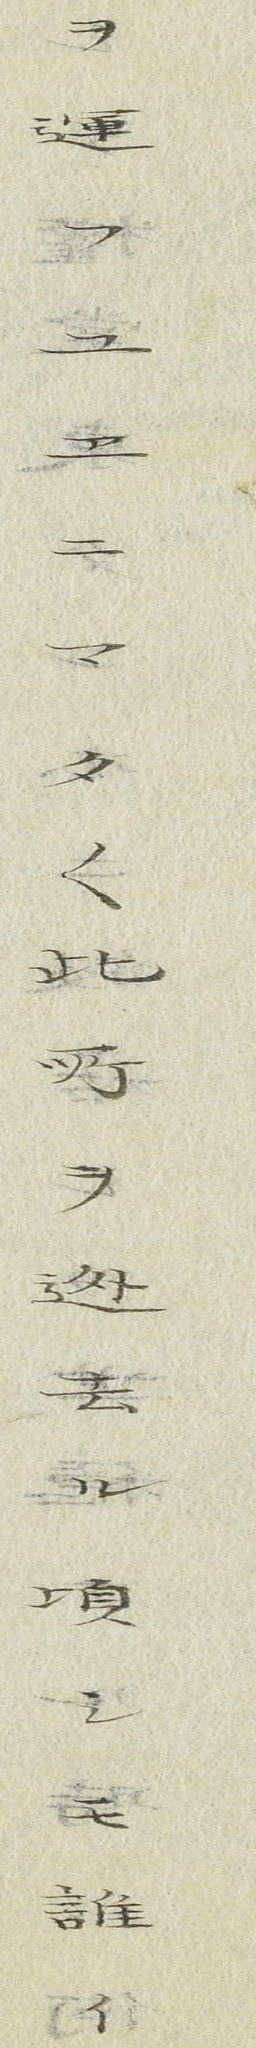ヲ運フユエニマタ〱此所ヲ迯去ル頃シモ誰イ
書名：地災撮要　地震之部　巻ノ二
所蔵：東京大学地震研究所図書室 Earthquake Research Institute Library, The University of Tokyo, JAPAN
